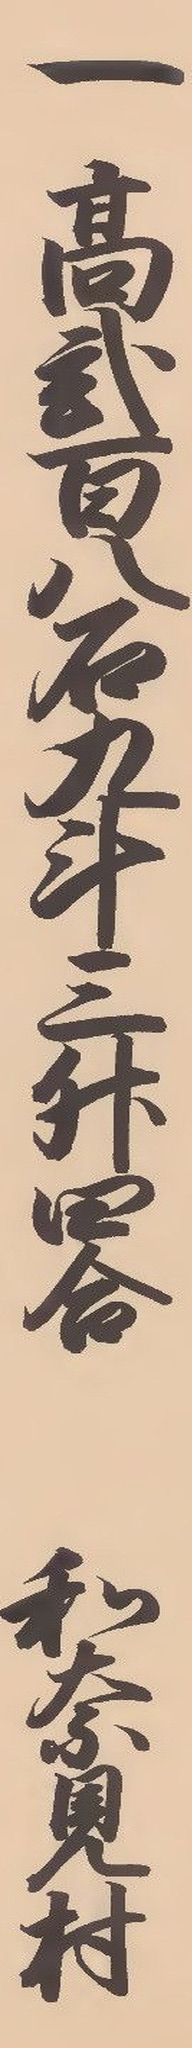一高弐百八石九斗三升四合和奈見村
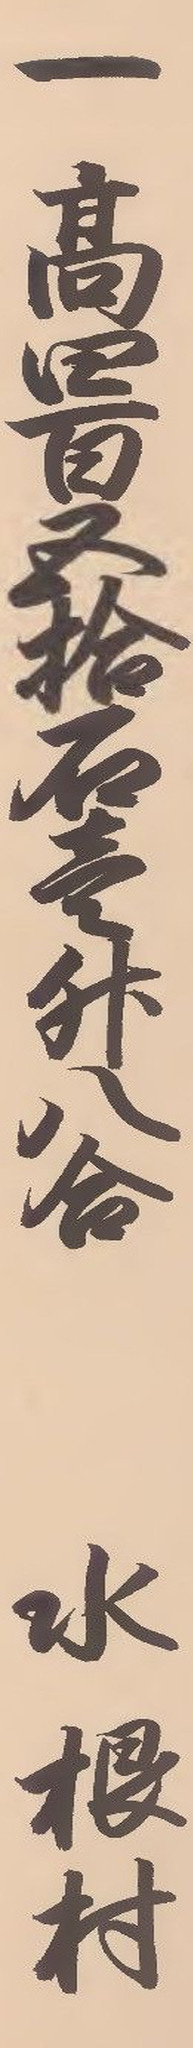一高四百五拾石壱升八合水根村
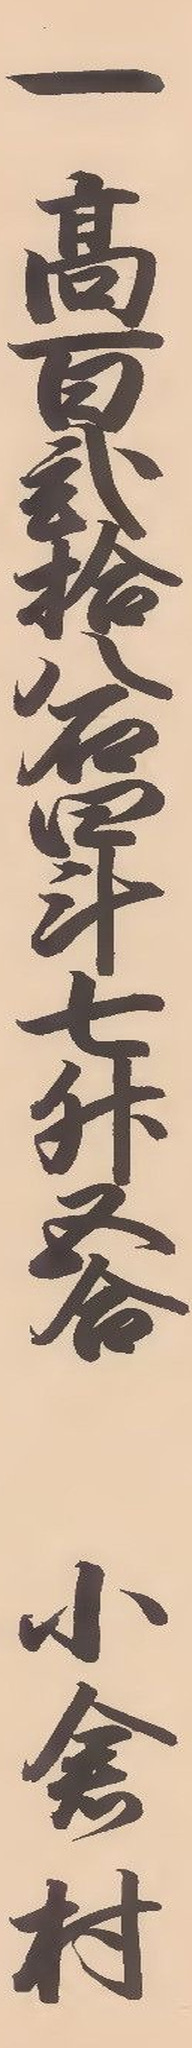一高百弐拾八石四斗七升五合小倉村
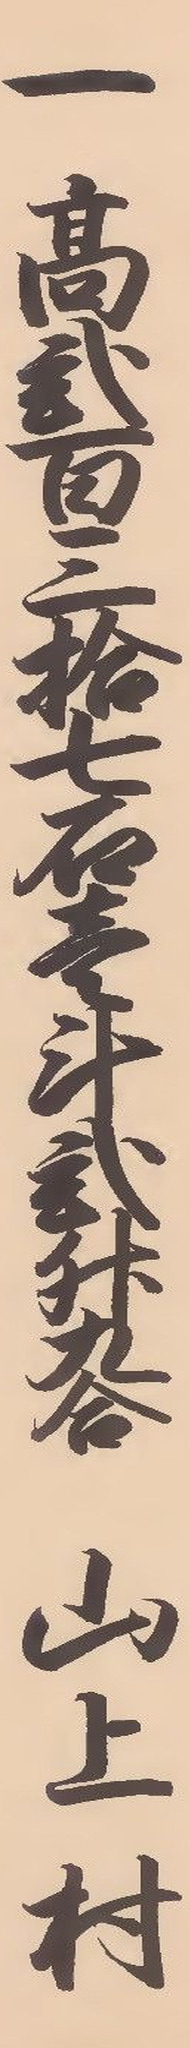一高弐百三拾七石壱斗弐升九合山上村
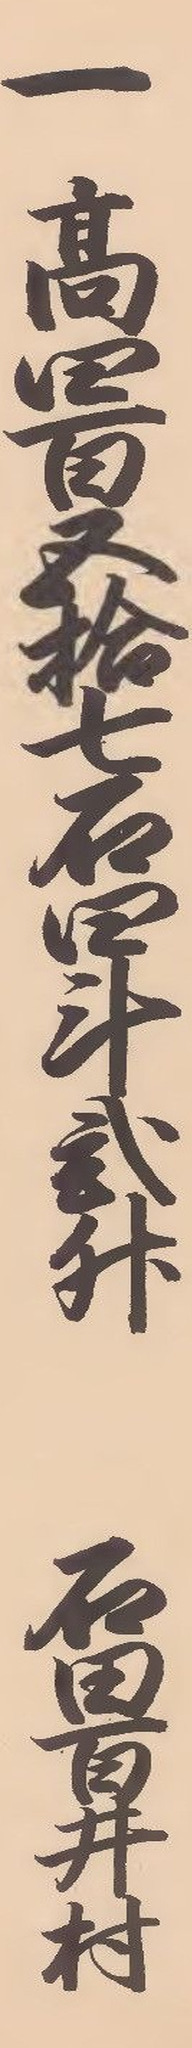一高四百五拾七石四斗弐升石田百井村

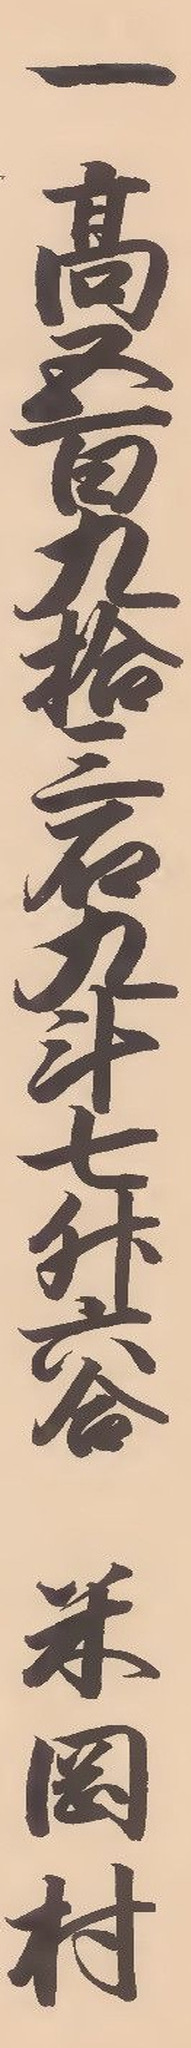一高五百九拾三石九斗七升六合米岡村
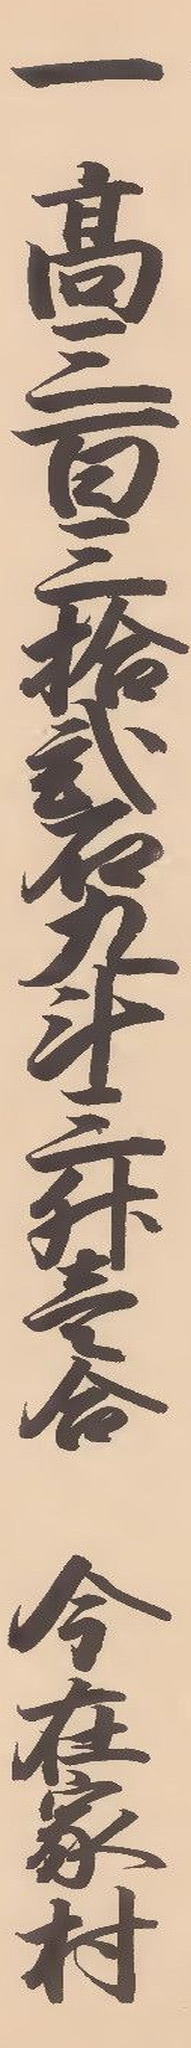一高三百三拾弐石九斗三升壱合今在家村
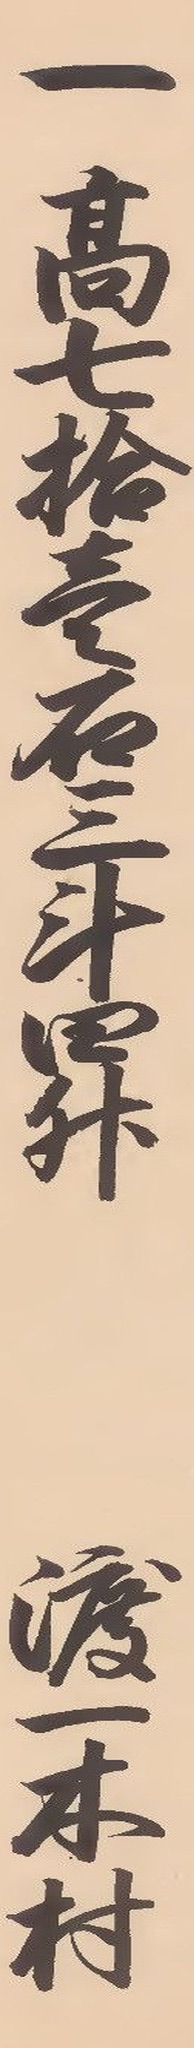一高七拾壱石三斗四升渡一木村
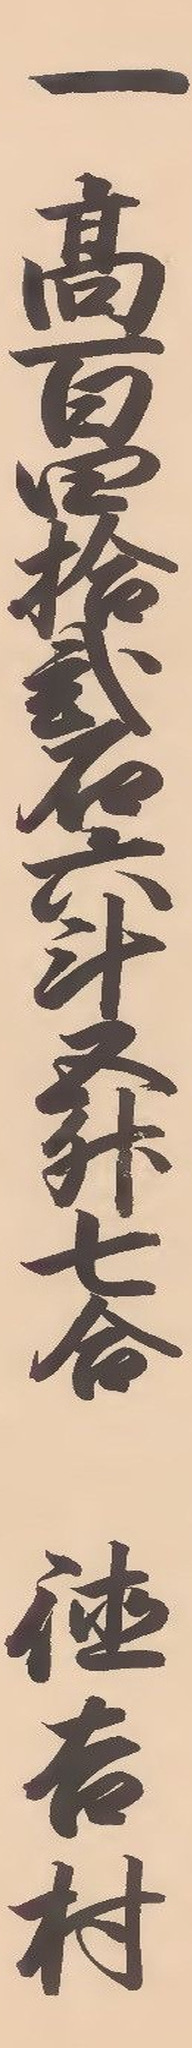一高百四拾弐石六斗五升七合徳吉村
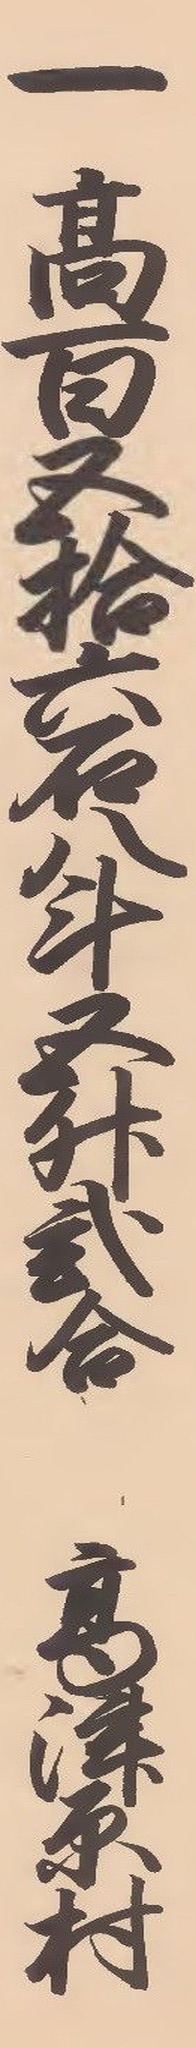一高百五拾六石八斗五升弐合高津原村
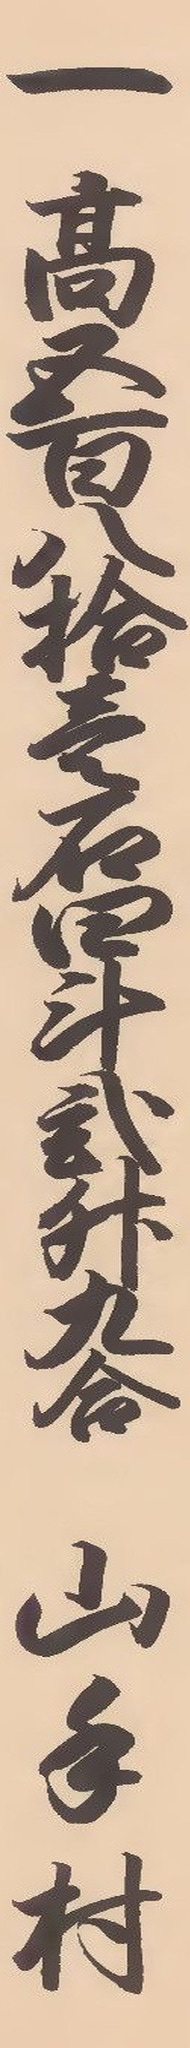一高五百八拾壱石四斗弐升九合山手村
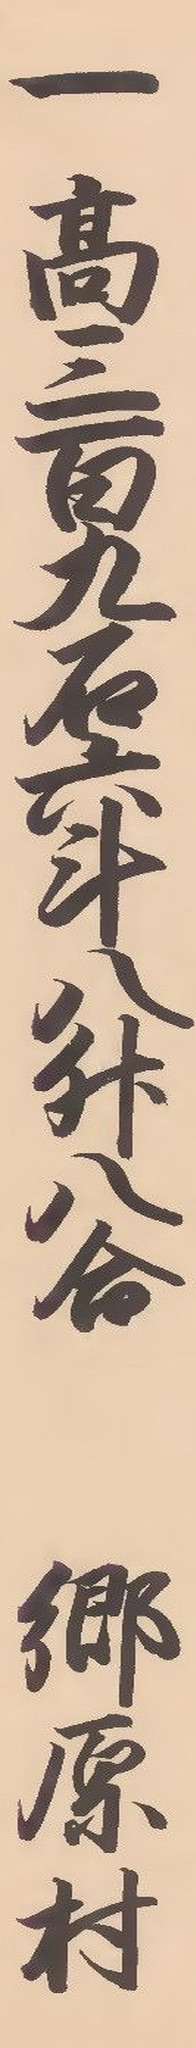一高三百九石六斗八升八合郷原村

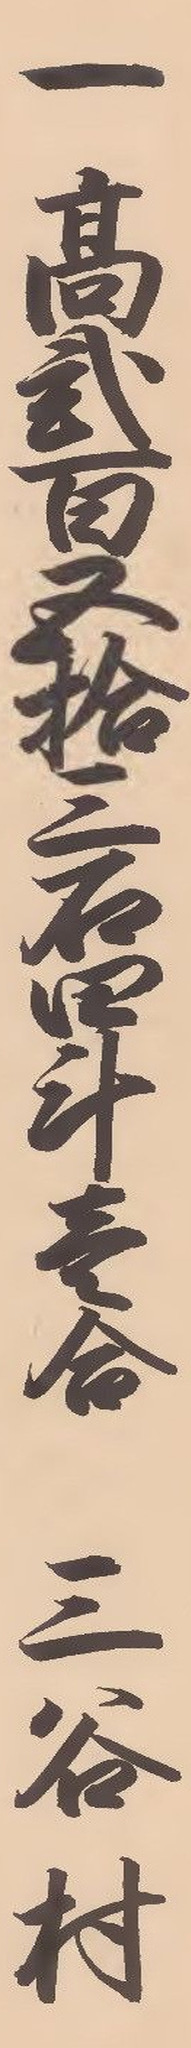一高弐百五拾三石四斗壱合三谷村
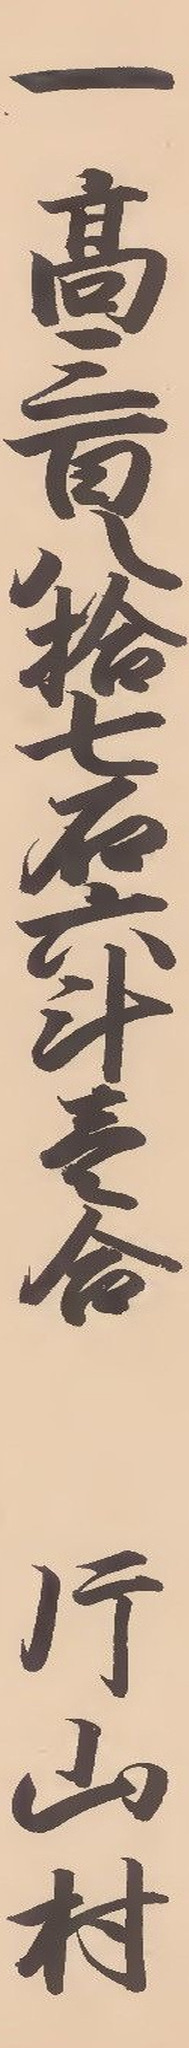一高三百八拾七石六斗壱合片山村
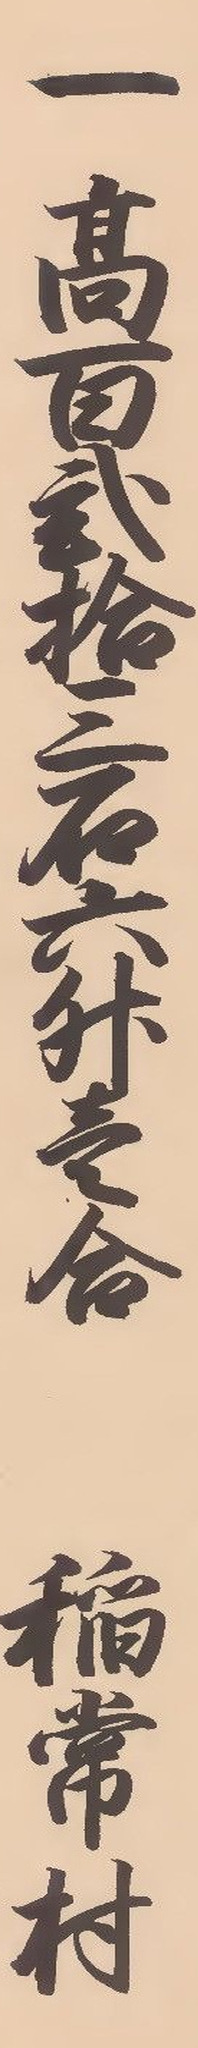一高百弐拾三石六升壱合稲常村
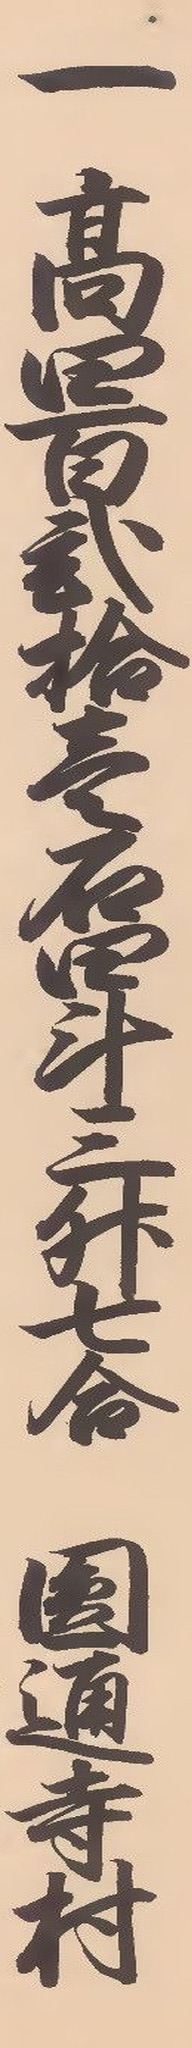一高四百弐拾壱石四斗三升七合円通寺村
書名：因幡国郷帳
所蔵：国立公文書館 National Archives of Japan
